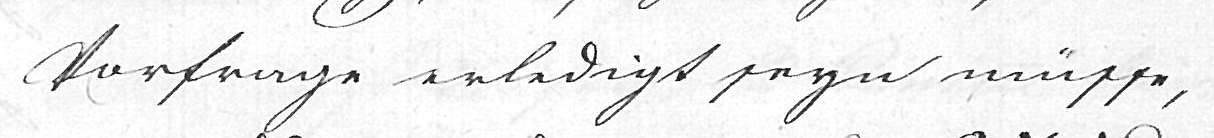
Vorfrage erledigt seyn müsse,
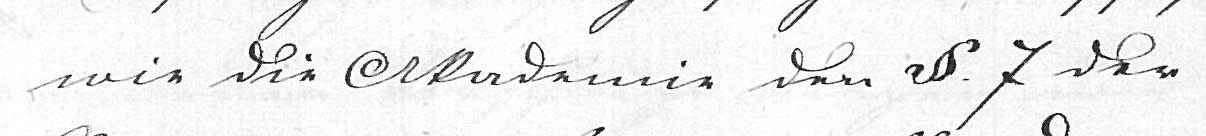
wie die Akademie den § 7 der
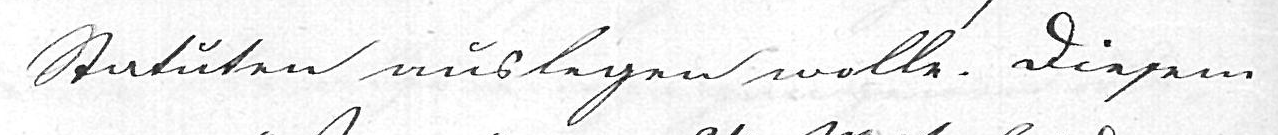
Statuten auslegen wolle. Diesem
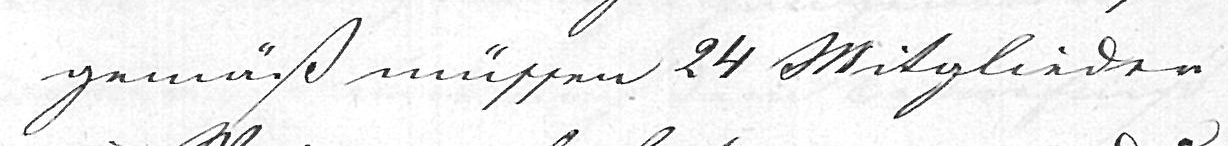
gemäß müssen 24 Mitglieder
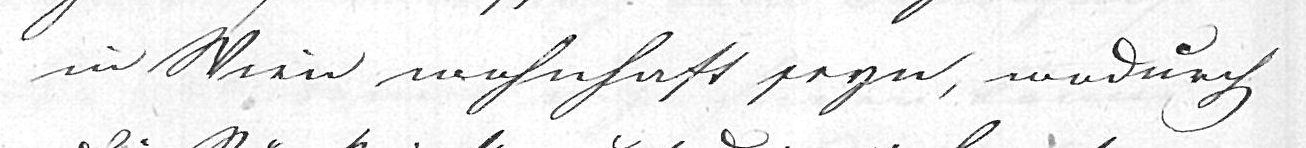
in Wien wohnhaft seyn, wodurch
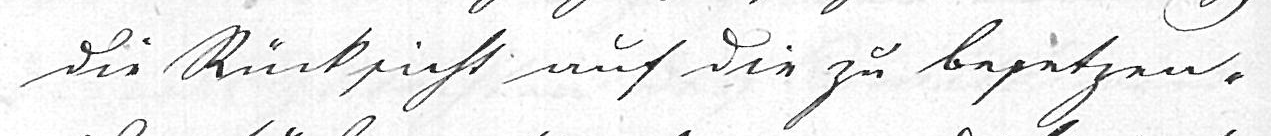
die Rücksicht auf die zu besetzen-
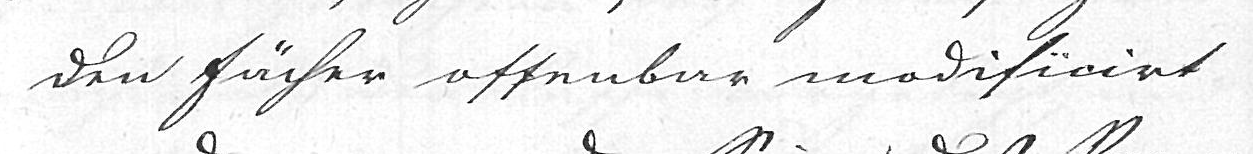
den Fächer offenbar modificirt
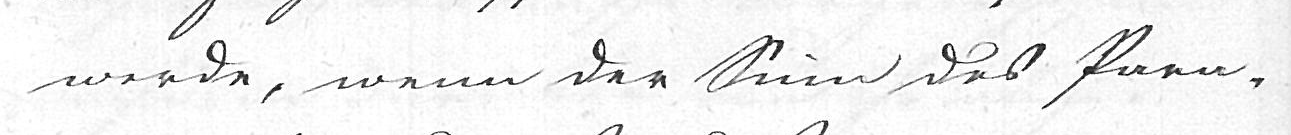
werde, wenn der Sinn des Para-
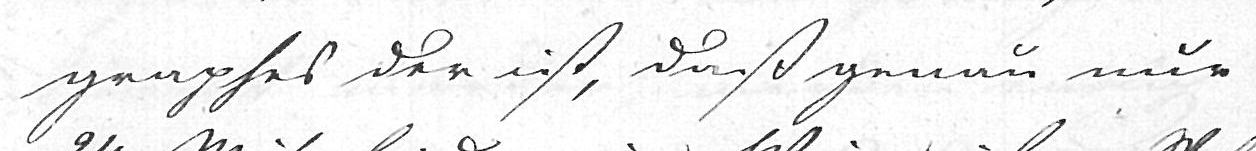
graphes der ist, daß genau nur
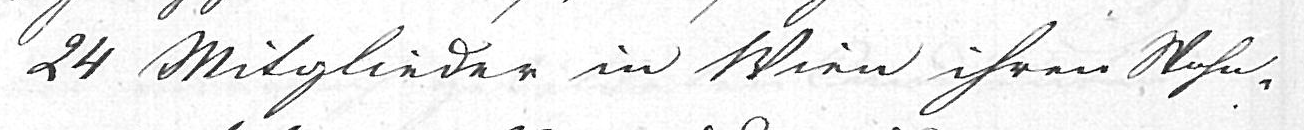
24 Mitglieder in Wien ihren Wohn-
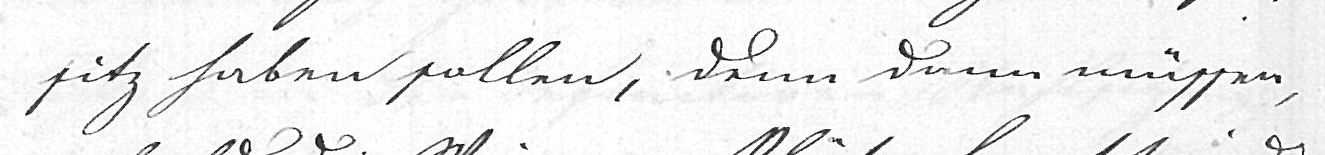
sizt haben sollen, denn dann müssen,
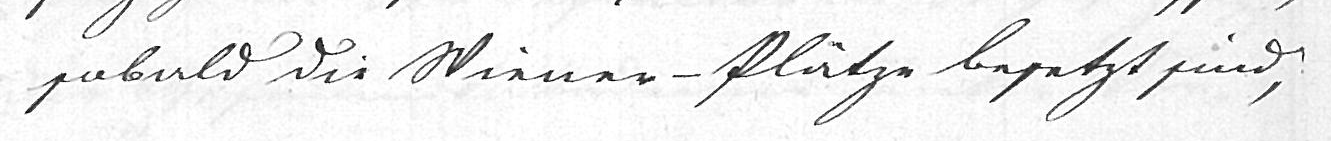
sobald die Wiener-Plätze besetzt sind,
